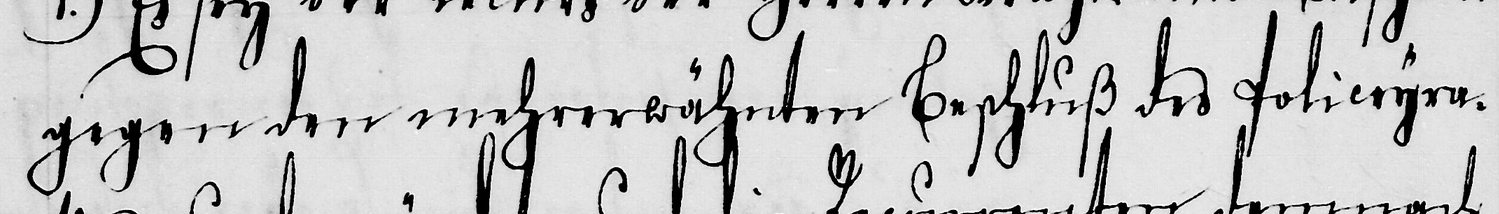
gegen den mehrerwähnten Beschluß des Policeyra¬
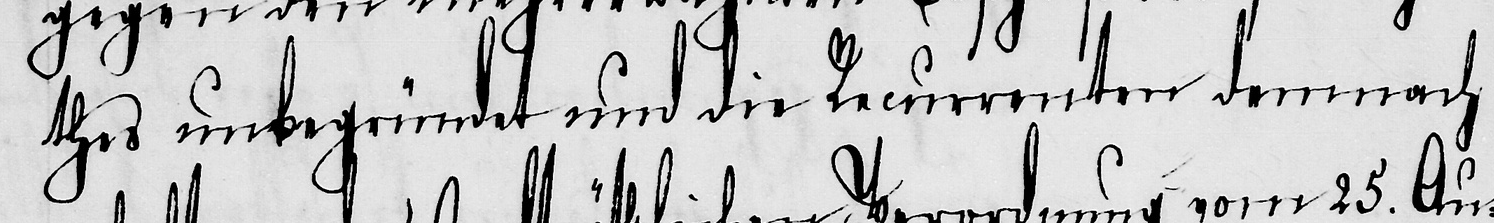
thes unbegründet und die Recurrenten demnach
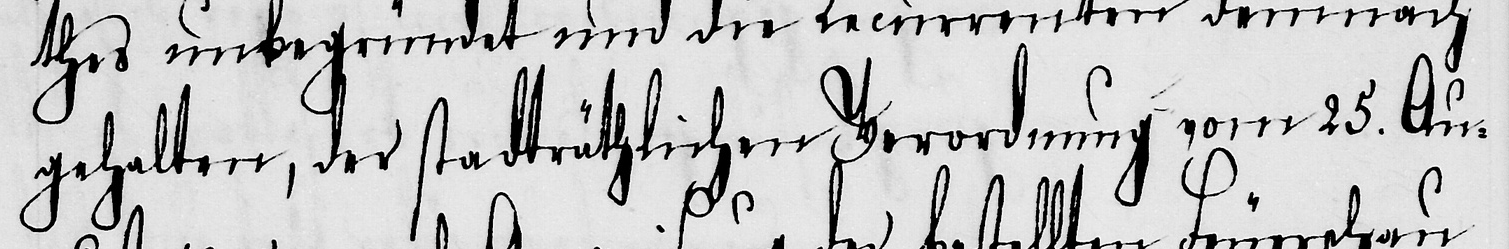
gehalten, der stadträthlichen Verordnung vom 25. Au¬
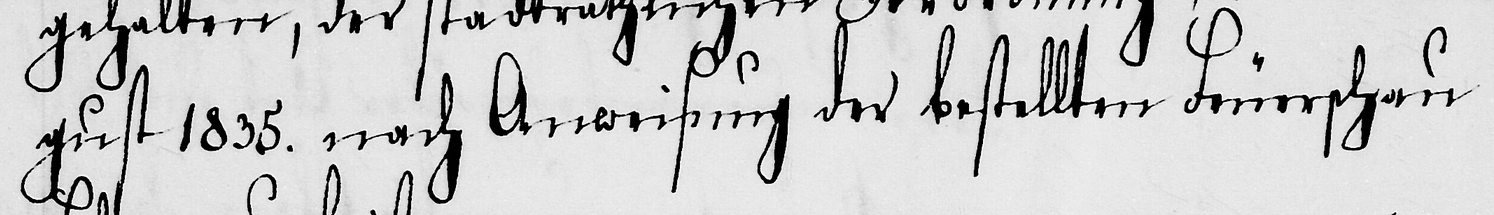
gust 1835. nach Anweisung der bestellten Feuerschau
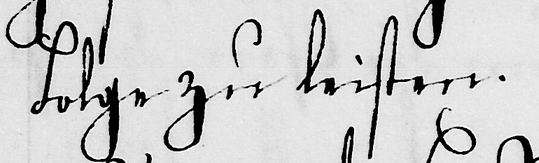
Folge zu leisten.
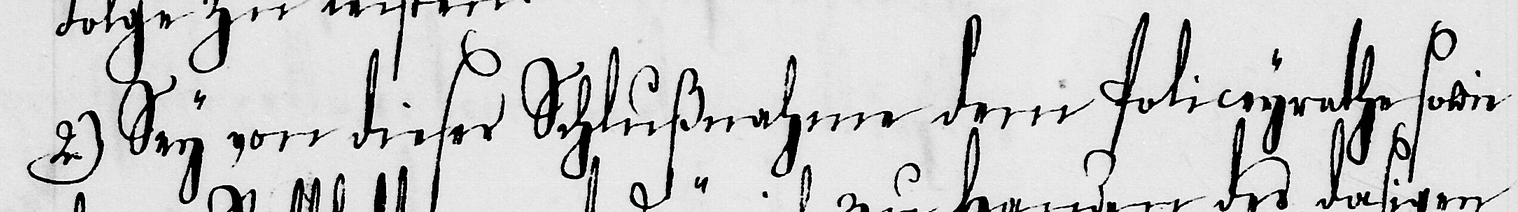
2.) Sey von dieser Schlußnahme dem Policeyrathe
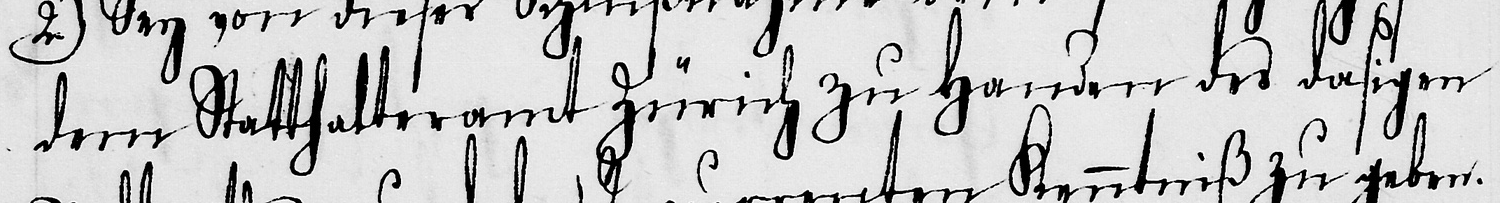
dem Statthalteramt Zürich zu Handen des dasigen
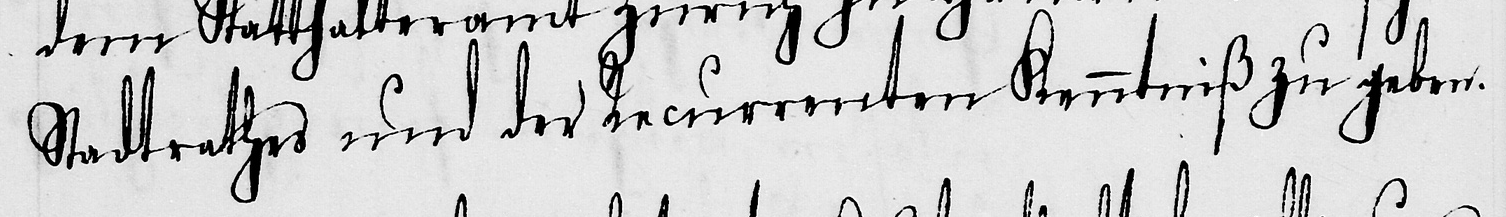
Stadtrathes und der Recurrenten Kenntniß zu geben.
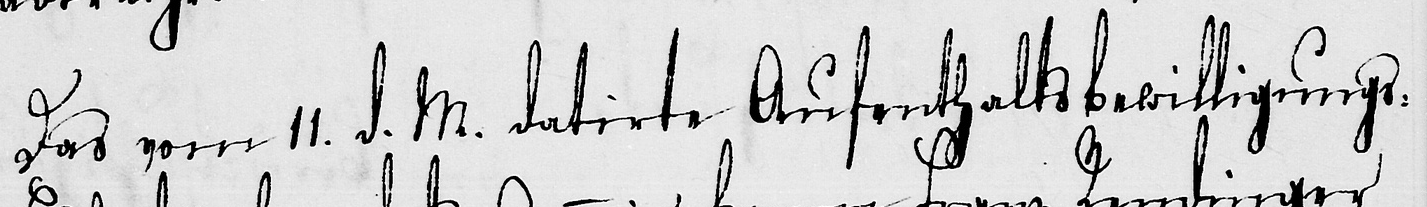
Das vom 11. d. M. datirte Aufenthaltsbewilligungs¬
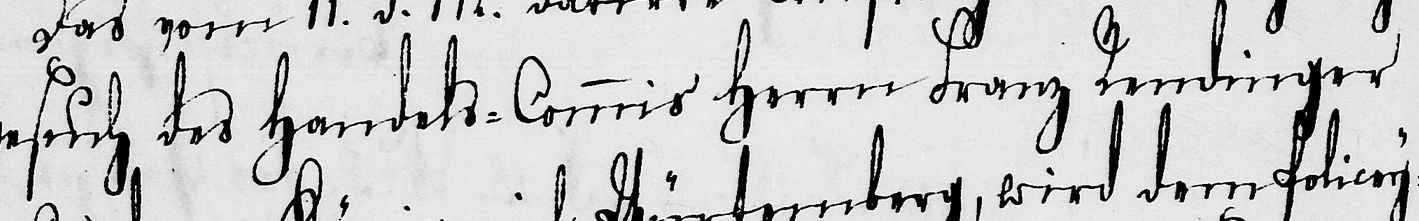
such des Handels-Commis Herrn Franz Rendinger
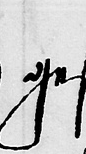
ge¬
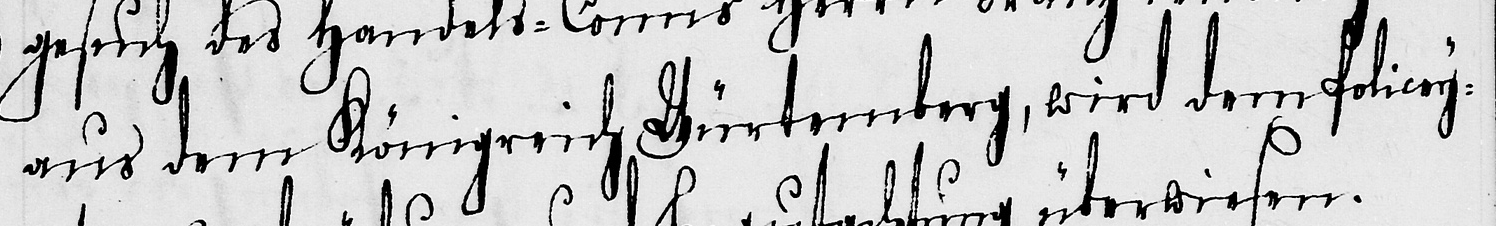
aus dem Königreich Würtemberg, wird dem Policey¬
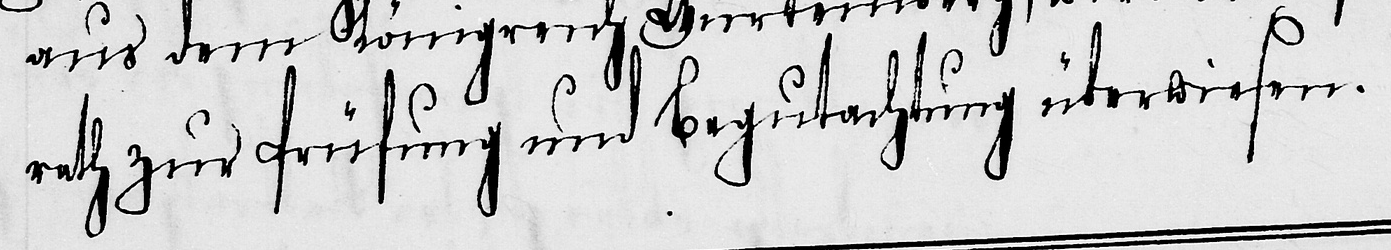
rath zur Prüfung und Begutachtung überwiesen.
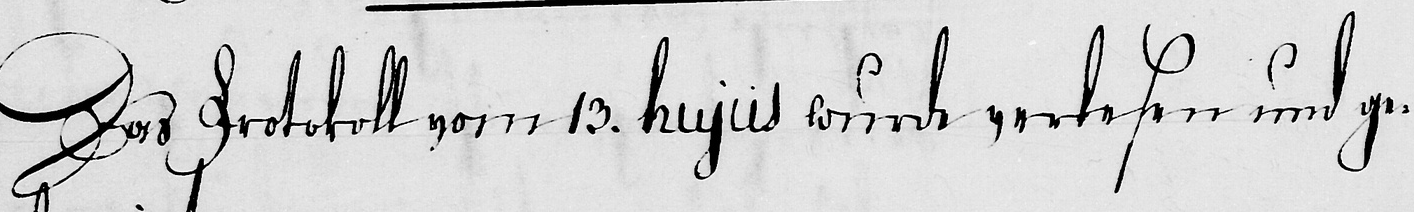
Das Protokoll vom 13. hujus wurde verlesen und g¬
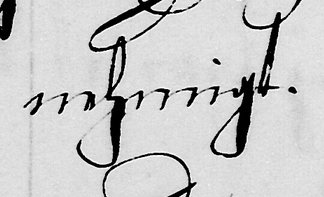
enehmigt.
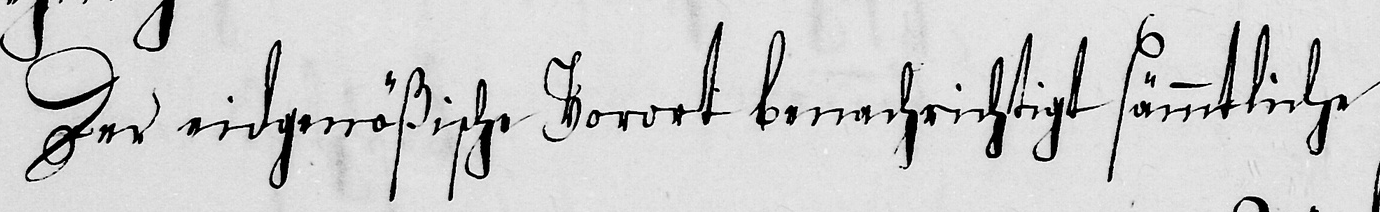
Der eidgenößische Vorort benachrichtigt sämmtliche
